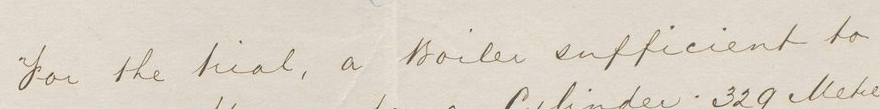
for the trial, a Boiler sufficient to
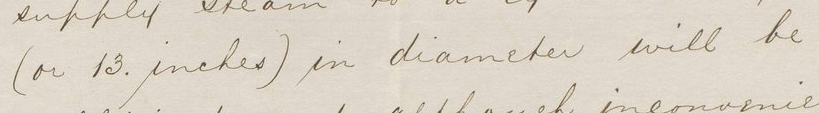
(or 13. inches) in diameter will be
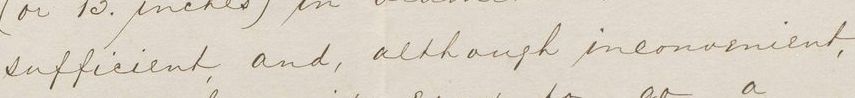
sufficient, and, although inconvenient,
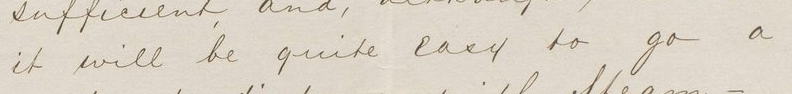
it will be quite easy to go a
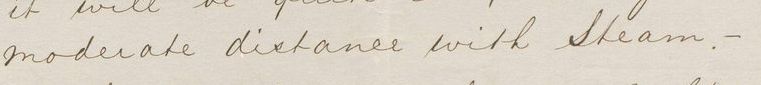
moderate distance with Steam. –
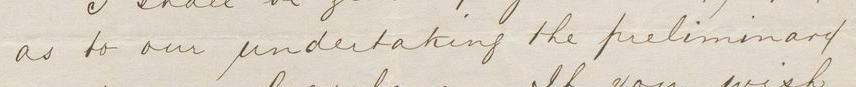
as to our undertaking the preliminary
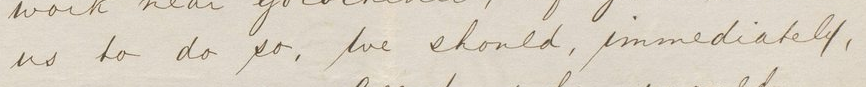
us to do so, we should, immediately,
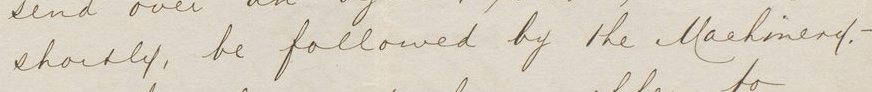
shortly, be followed by the Machinery. –
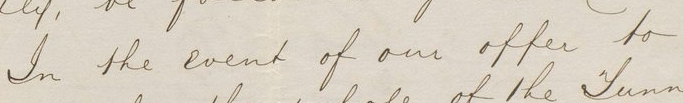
In the event of our offer to
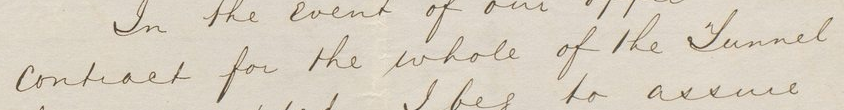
contract for the whole of the Tunnel
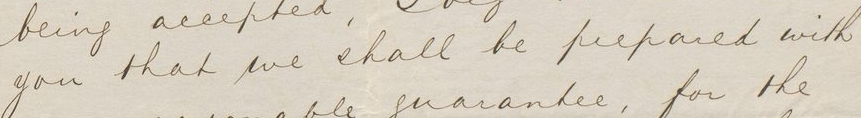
you that we shall be prepared with
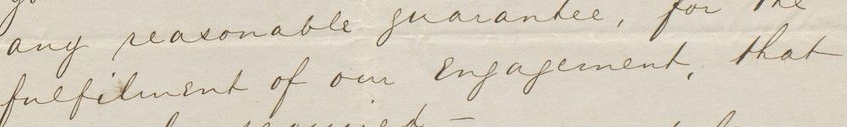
fulfilment of our engagement, that
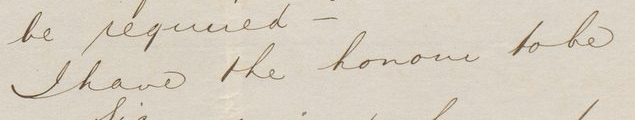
I have the honour to be
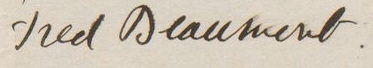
Fred Beaumont.
